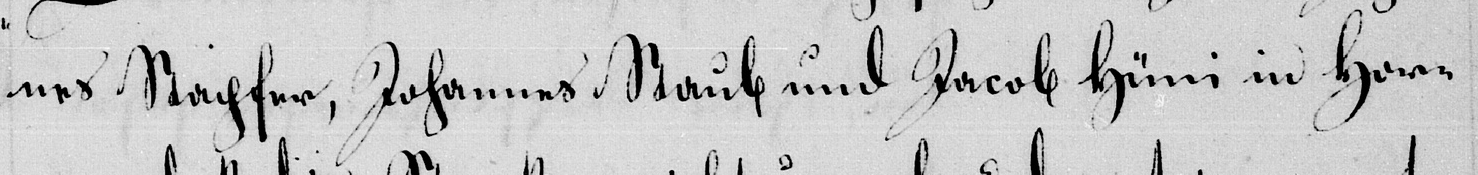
nes Stapfer, Johannes Staub und Jacob Hüni in Hor¬
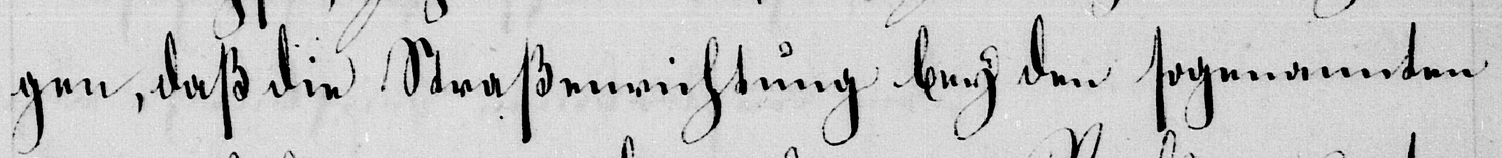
gen, daß die Straßenrichtung bey den sogenannten
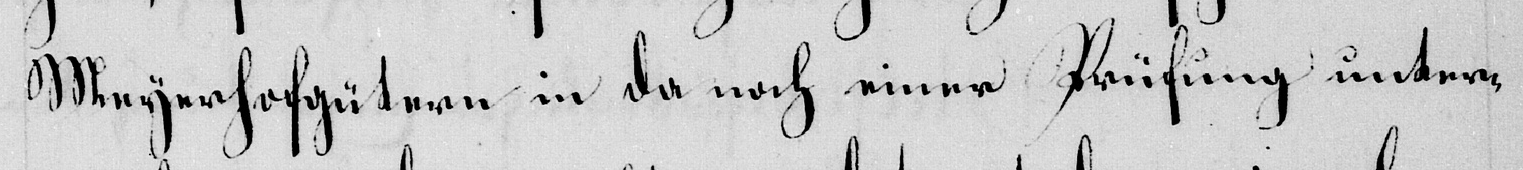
Weyerhofgütern in da noch einer Prüfung unter¬
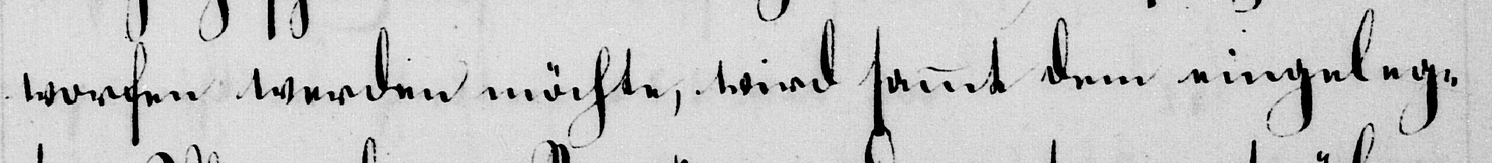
worfen werden möchte, wird sammt dem eingeleg¬
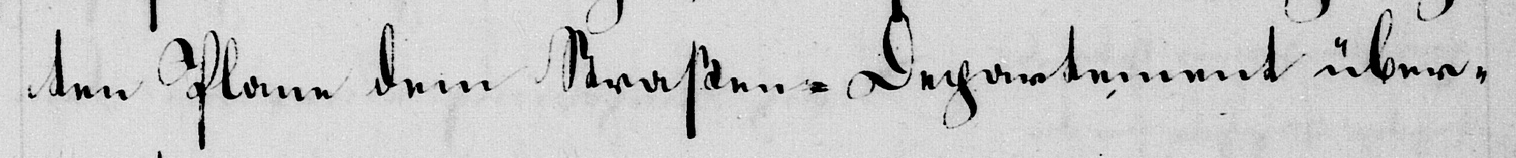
ten Plane dem Straßen-Departement über¬
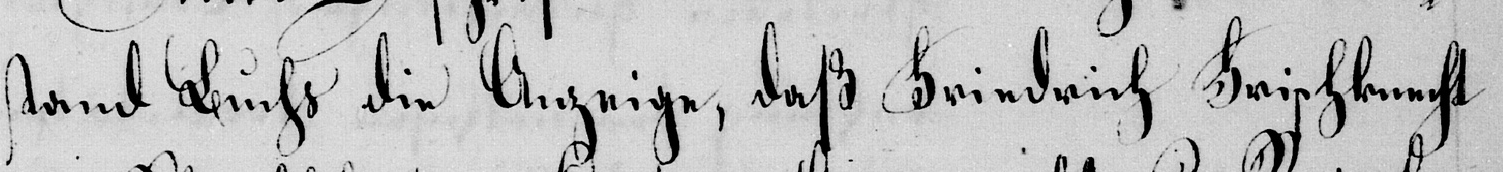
tand Buchs die Anzeige, daß Friedrich Frischknecht
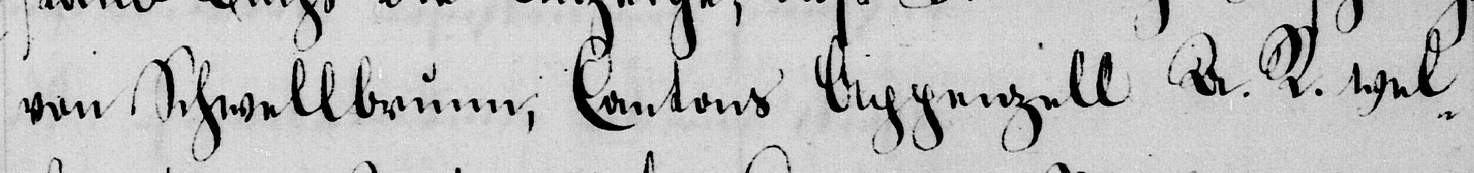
von Schwellbrunn, Cantons Appenzell A. R. wel¬
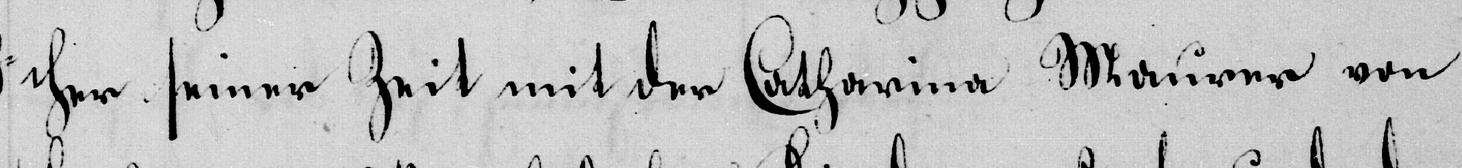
cher seiner Zeit mit der Catharina Maurer von
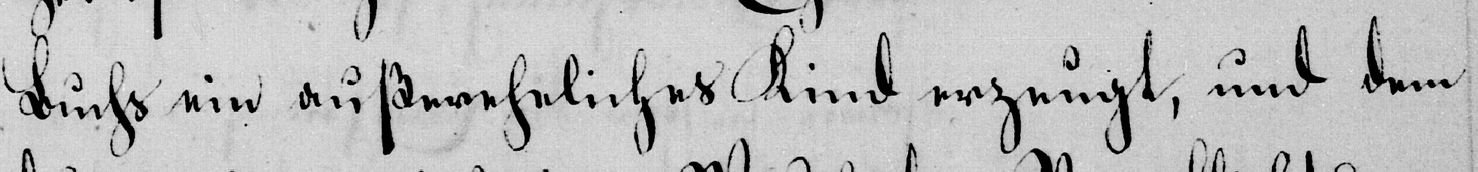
Buchs ein außereheliches Kind erzeugt, und dem
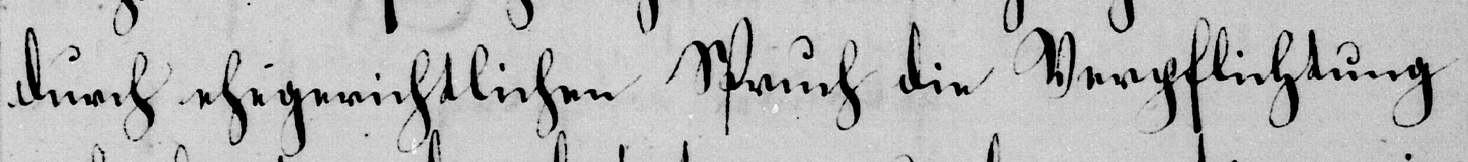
durch ehegerichtlichen Spruch die Verpflichtung
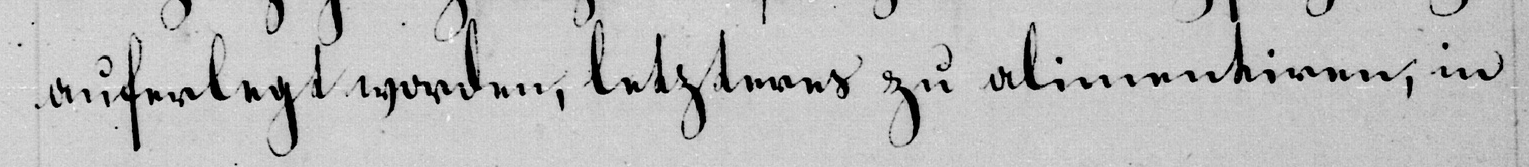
auferlegt worden, letzteres zu alimentiren, in
